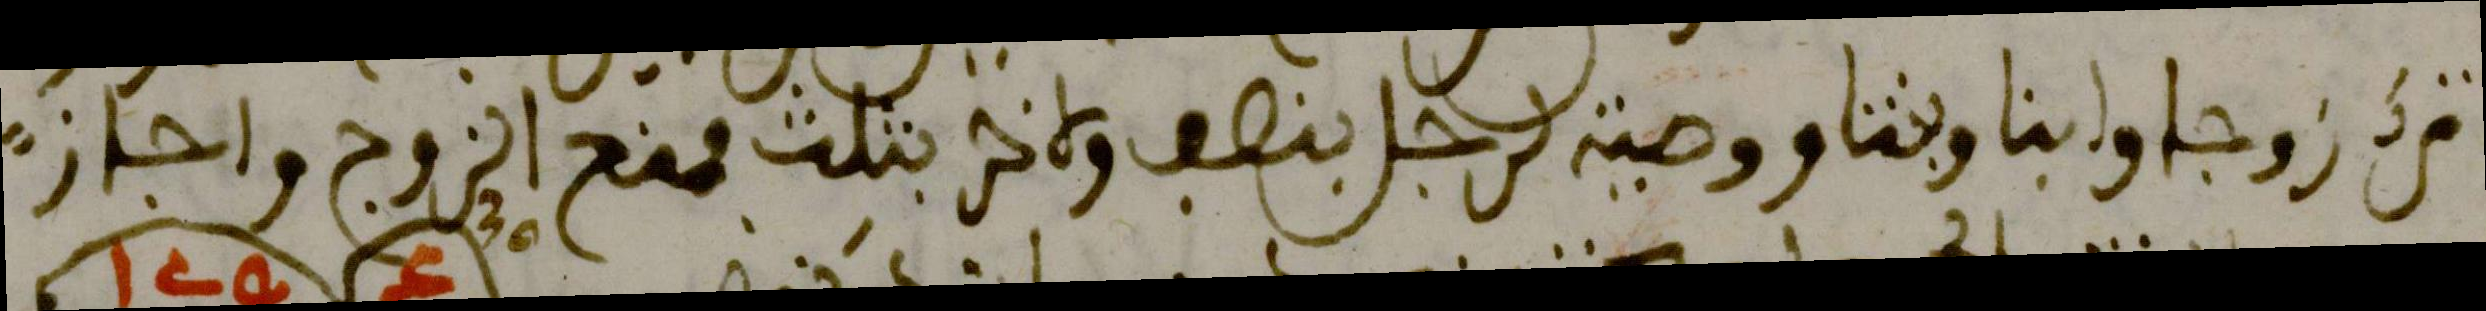ترك زوجا وابنا وبمتا ووصشة لرجل بنصف ولاخر بثلث فمنع الزوج واجاز
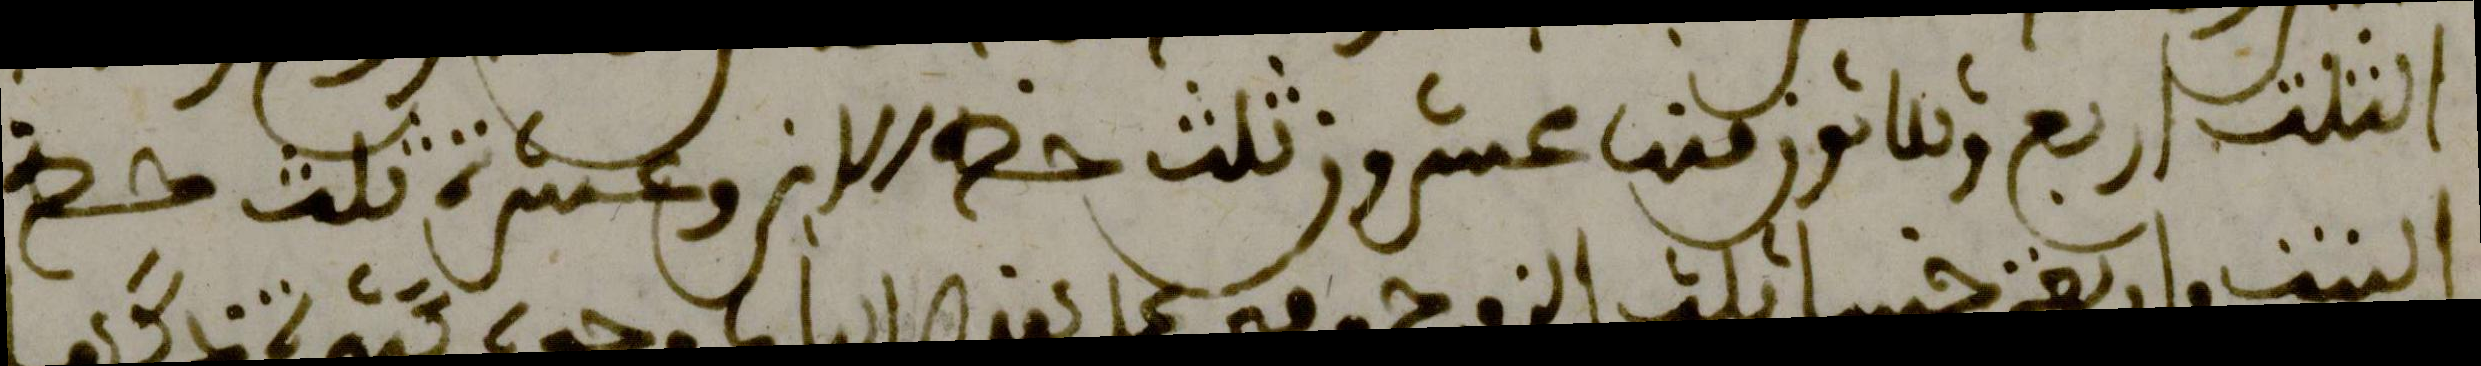الثلث اربع وثلاثون منها عشرون ثاث حظ الابن وعشرة ثلث حظ
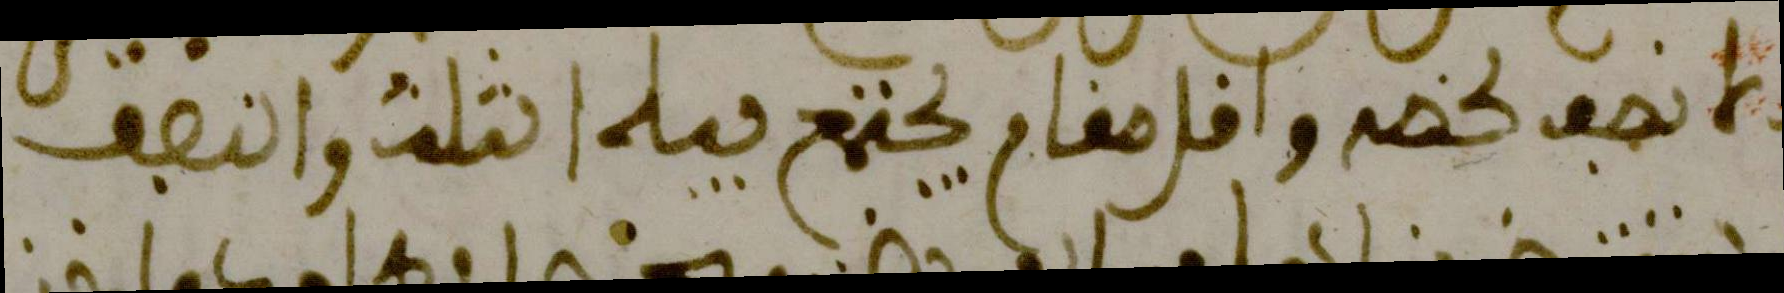لا نصف لحضه واقل مقام يجتمع فيه الثلث والنصف
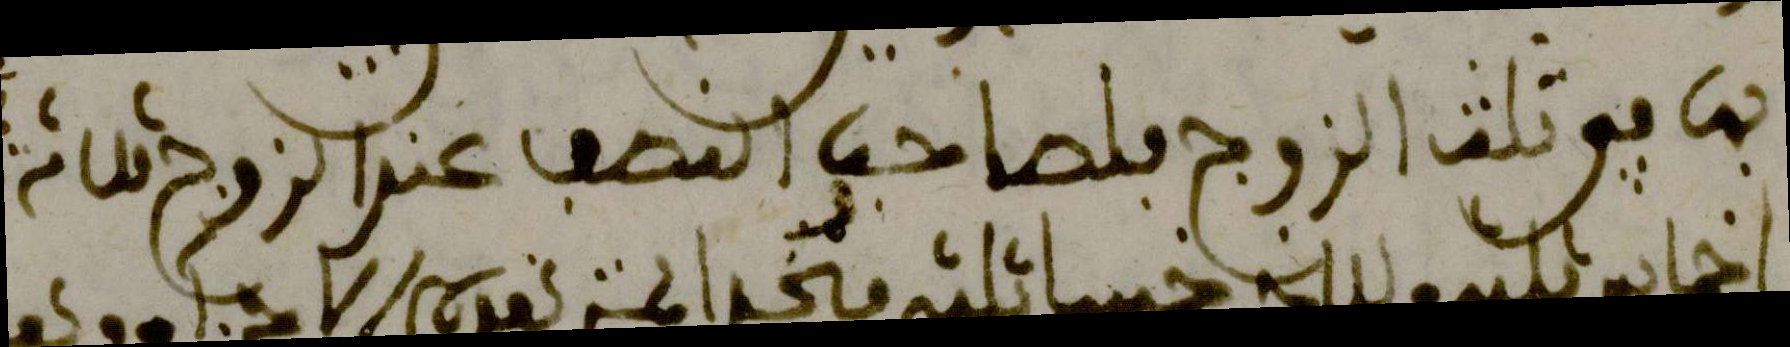بها في ثلث الزوج فلصاحب النصف عند الزوج ثلاثة
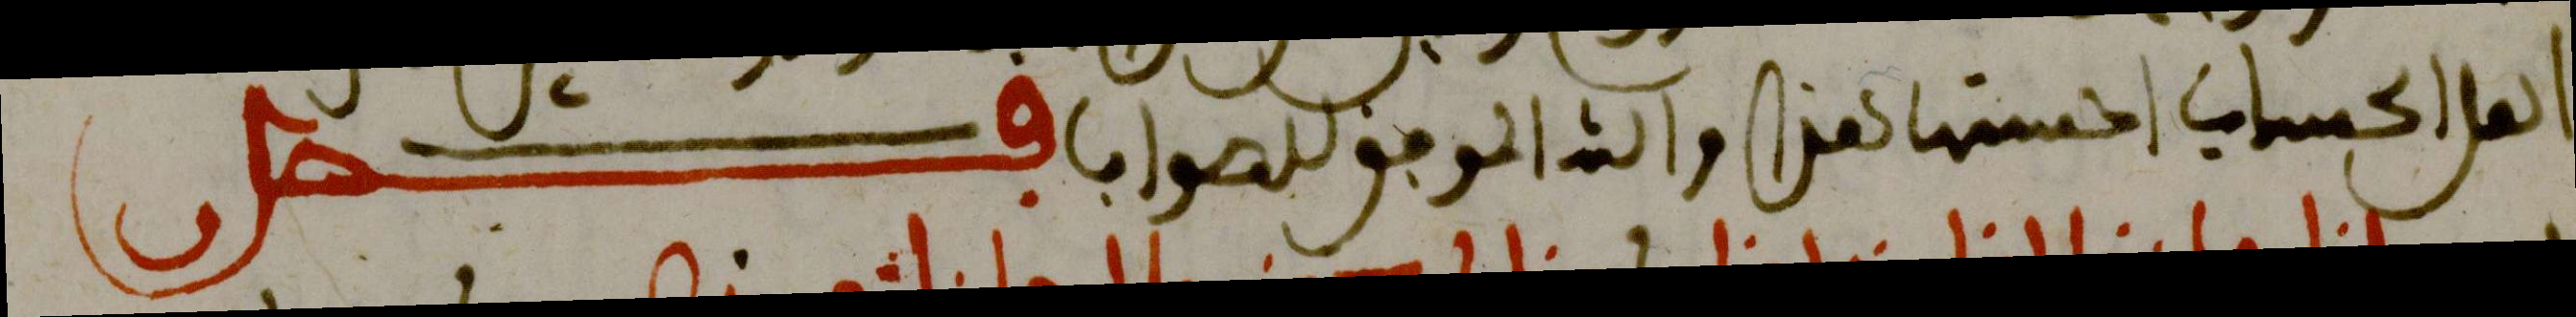اهل الحساب احسنها هذا والله الموفق للصواب فصل
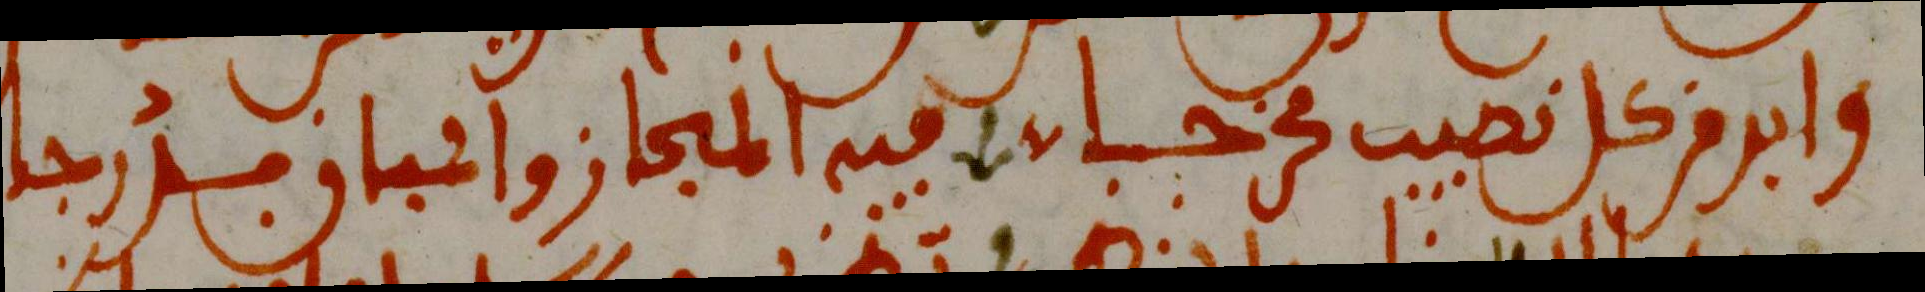وابد من كل نصيب مخرجا فيه المجاز والمبان مدرجا
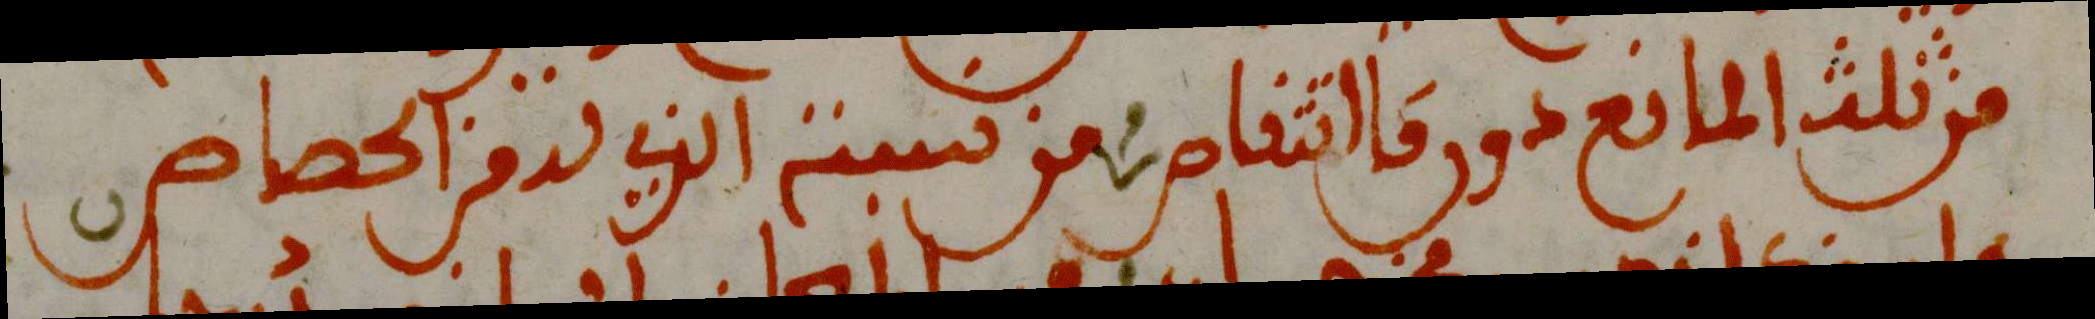من ثلث المانع دون ما اتتقاص من نسبته الذي له من الحصاص
